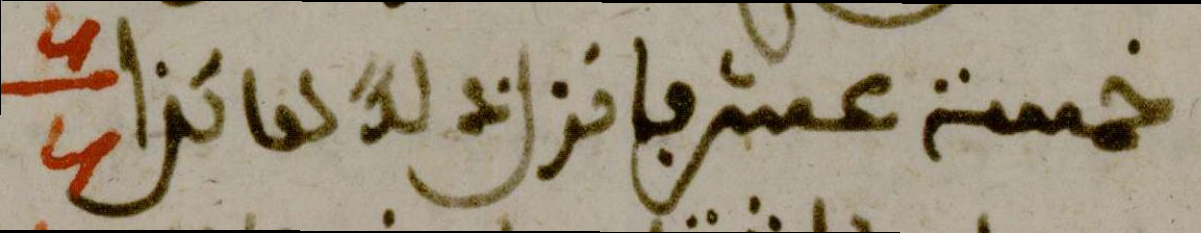خمسة عشر فانزل ذلك هاكذا
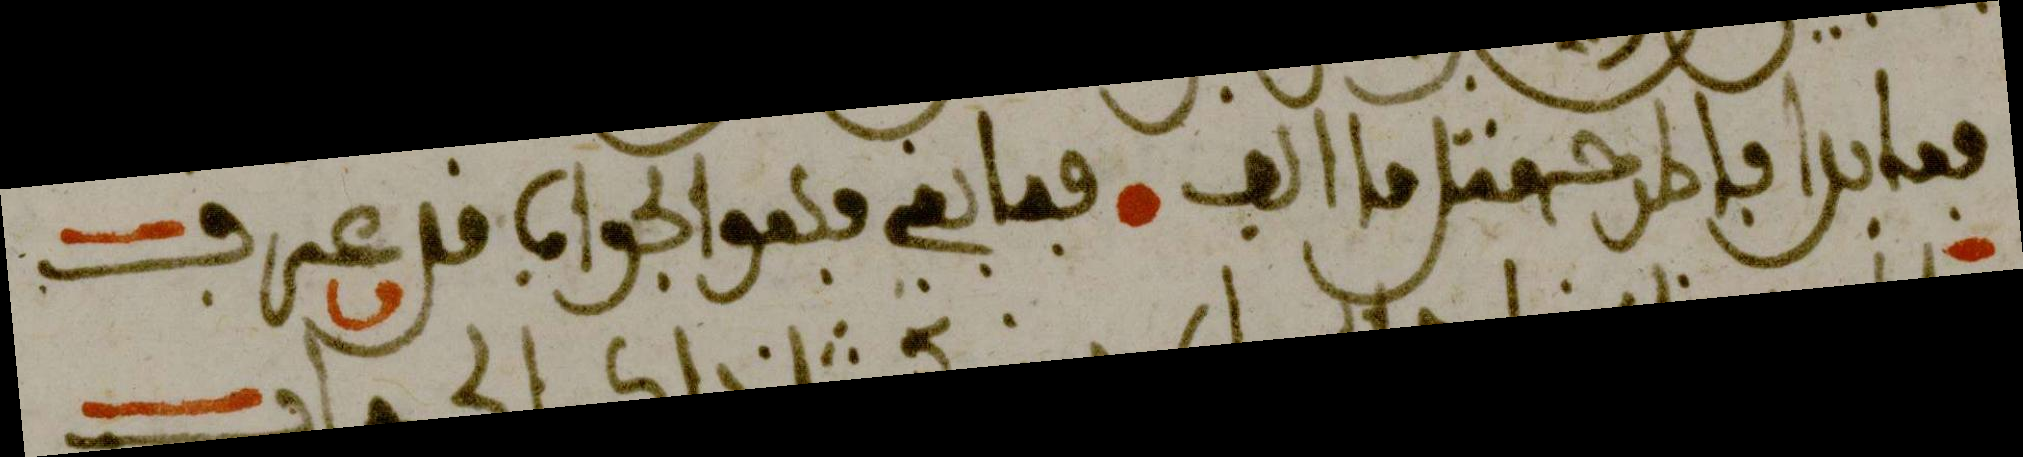فما بدا فاطرحه مثل ما الف فما بقي فهو الجواب قد عرف
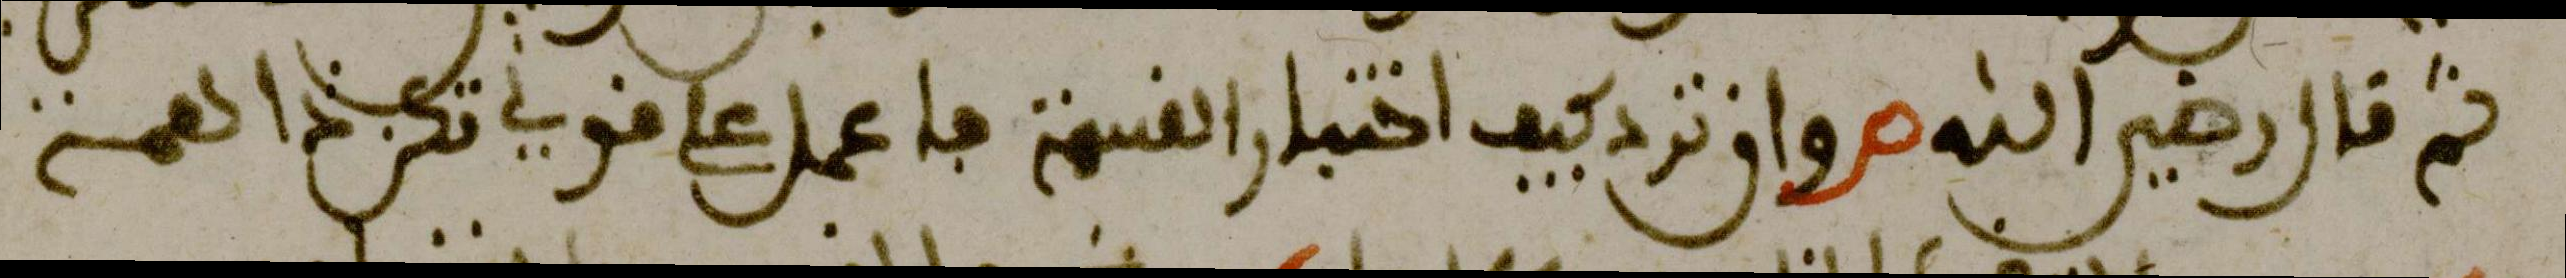ثم قال رضي الله ص و ان ترد كيف اختبار القسمة فاعمل على قولي تكن ذا همة
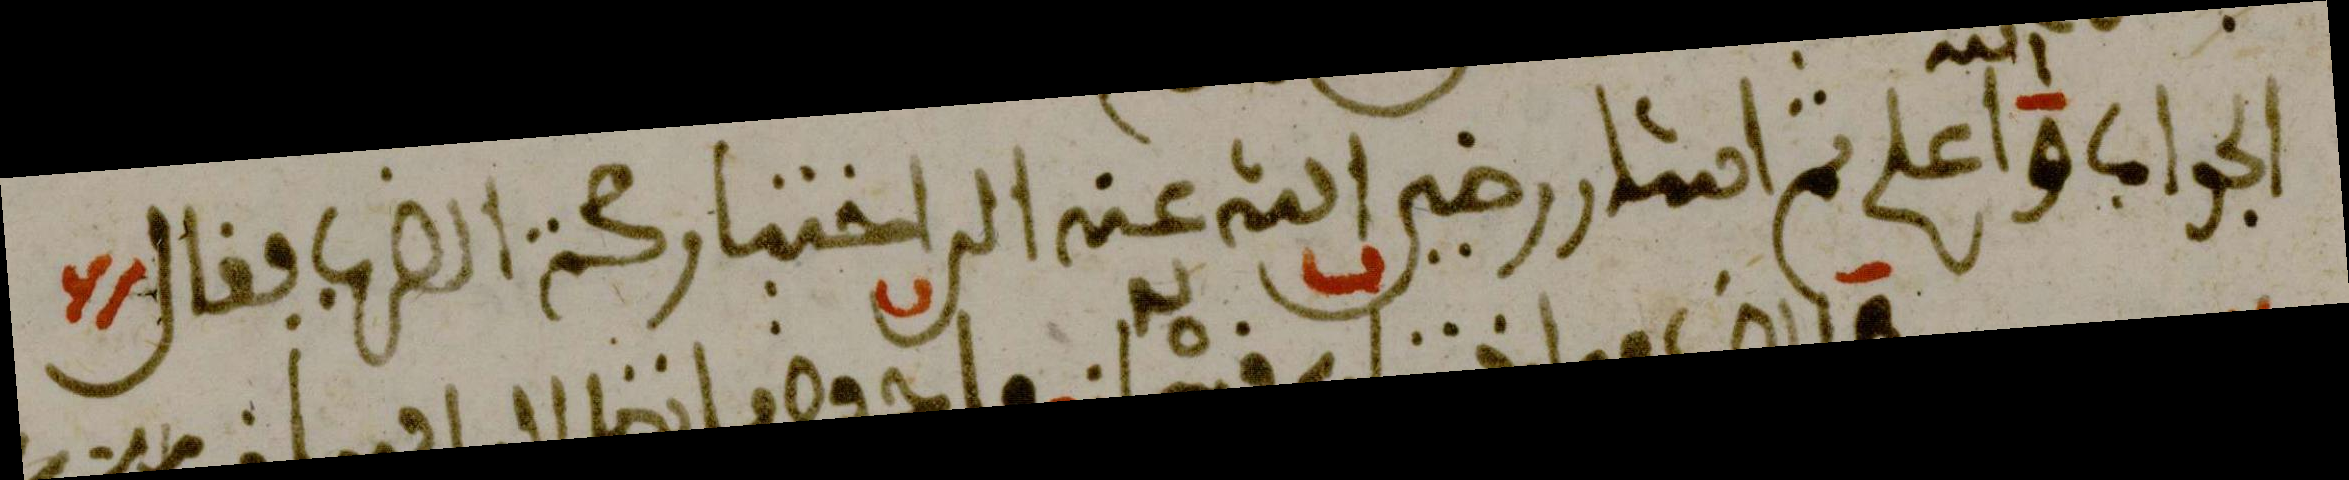الجواب و اعلم ثم اشار رضي الله عنه الى اختبار صحة الضرب فقال
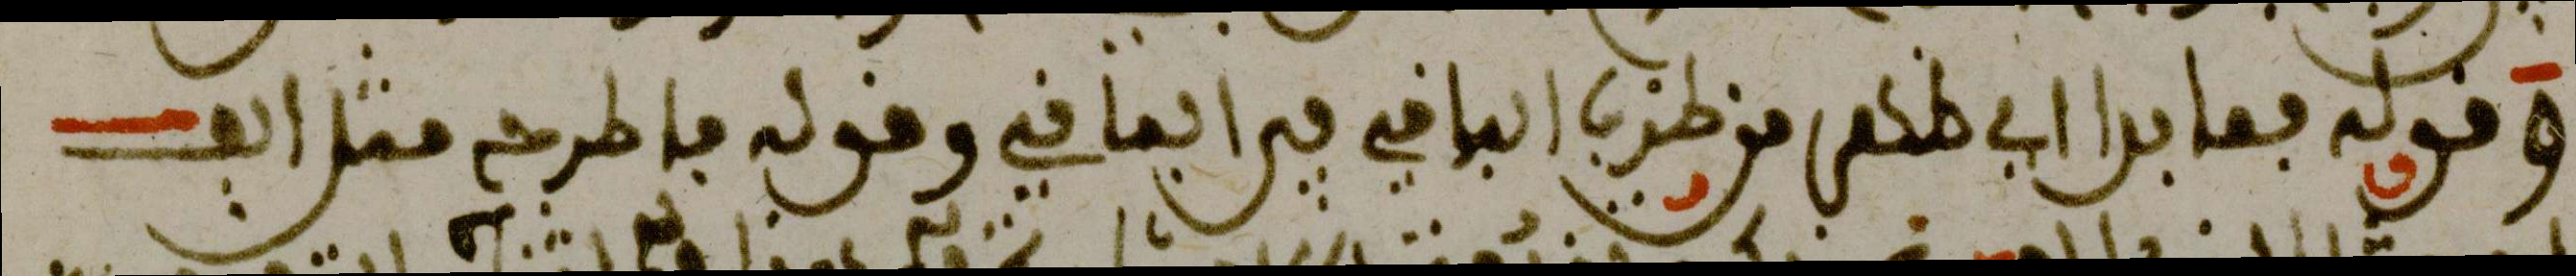و قوله بما بدا اي ظهر من ظرب الباقي في الباقي و قوله فاطرحه مثل الف
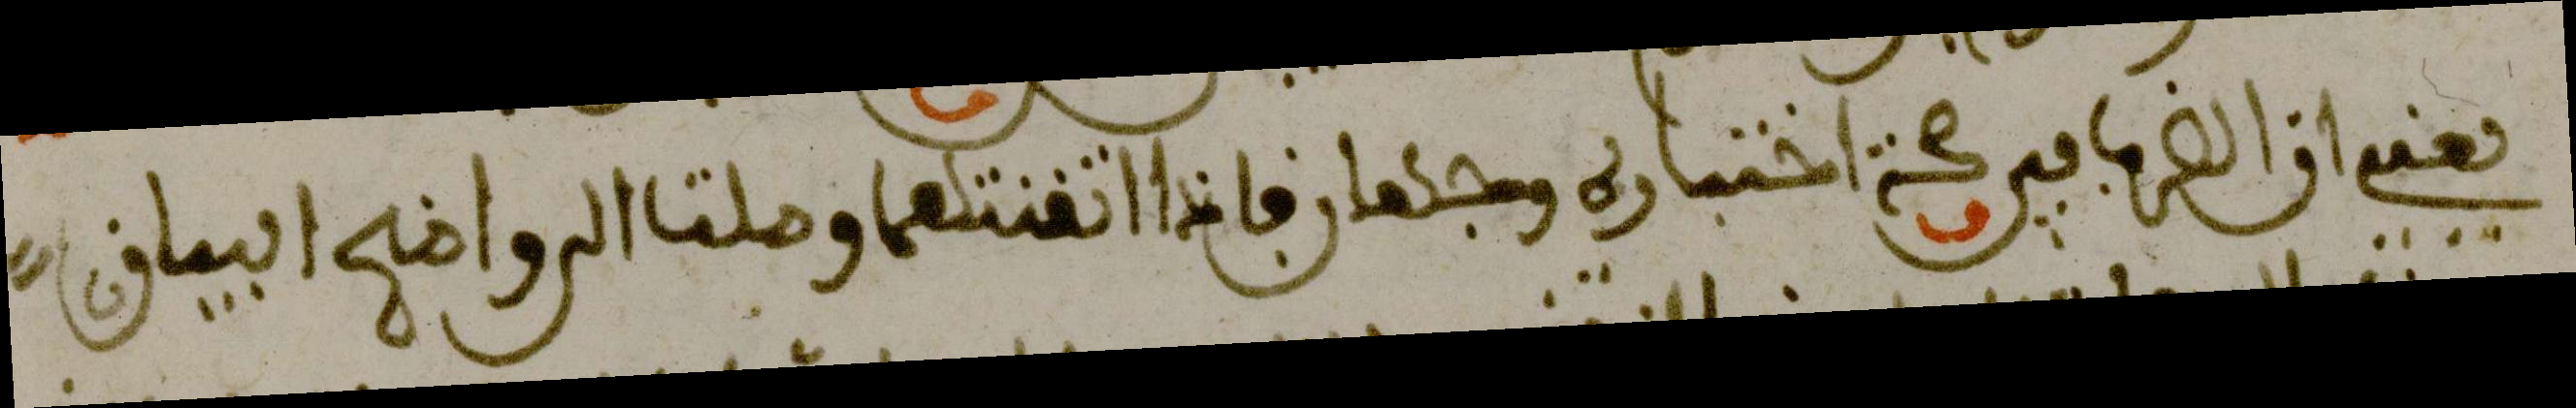يعني ان الضرب في صحة اختباره وجهان فاذا اتقنتهما وصلت الى واضح البيان
